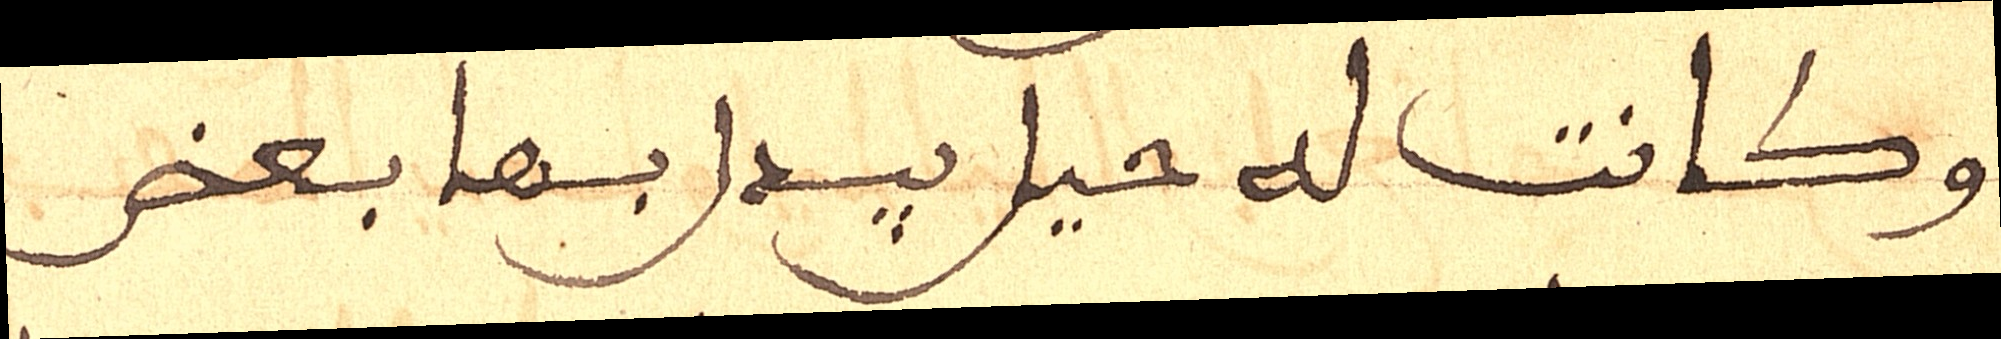وكانت له حيل يبدل بها بعض
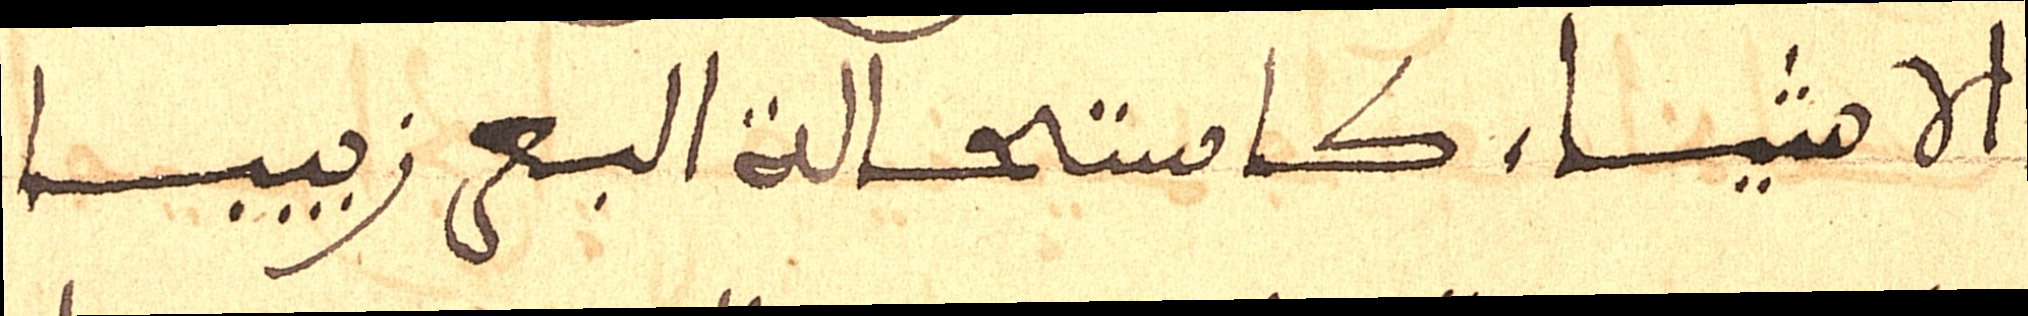الاشياء كاستحالة البعر زبيبا
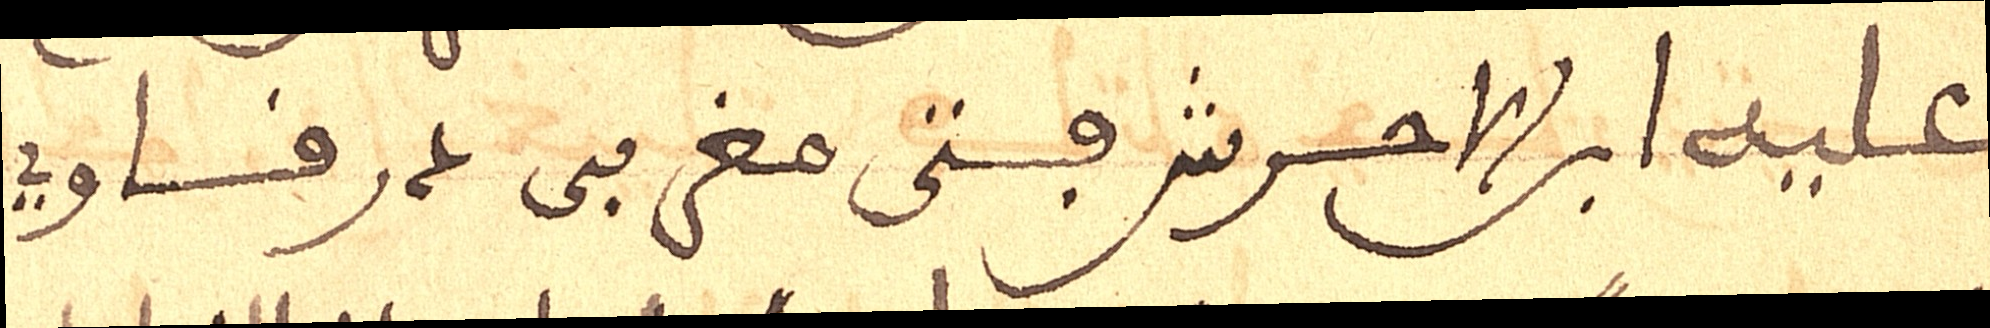عليه ابن الاحرش فتى مغربى درقاوي
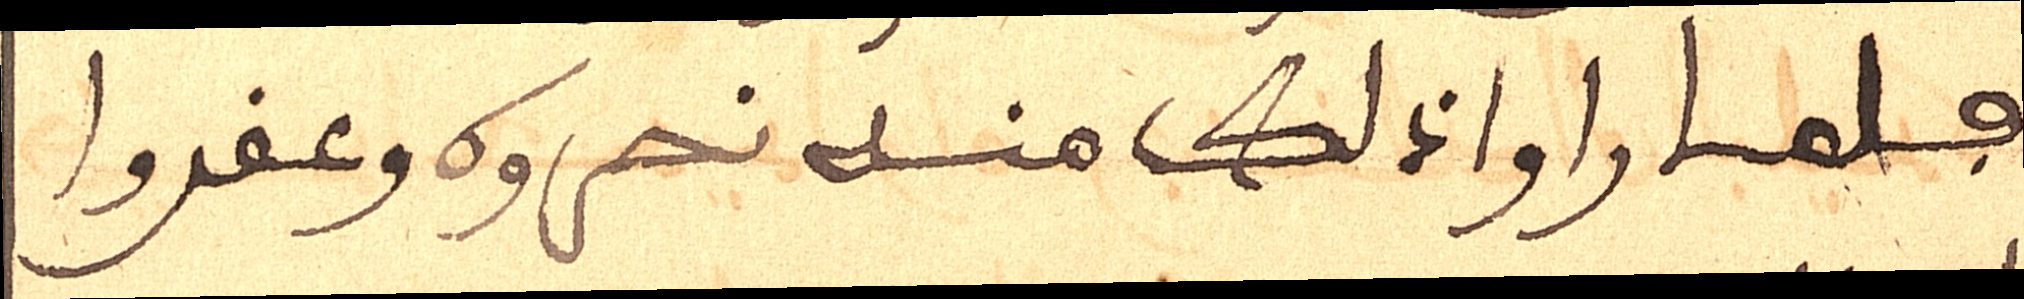فلما راوا ذلك منه نصروه وعقروا
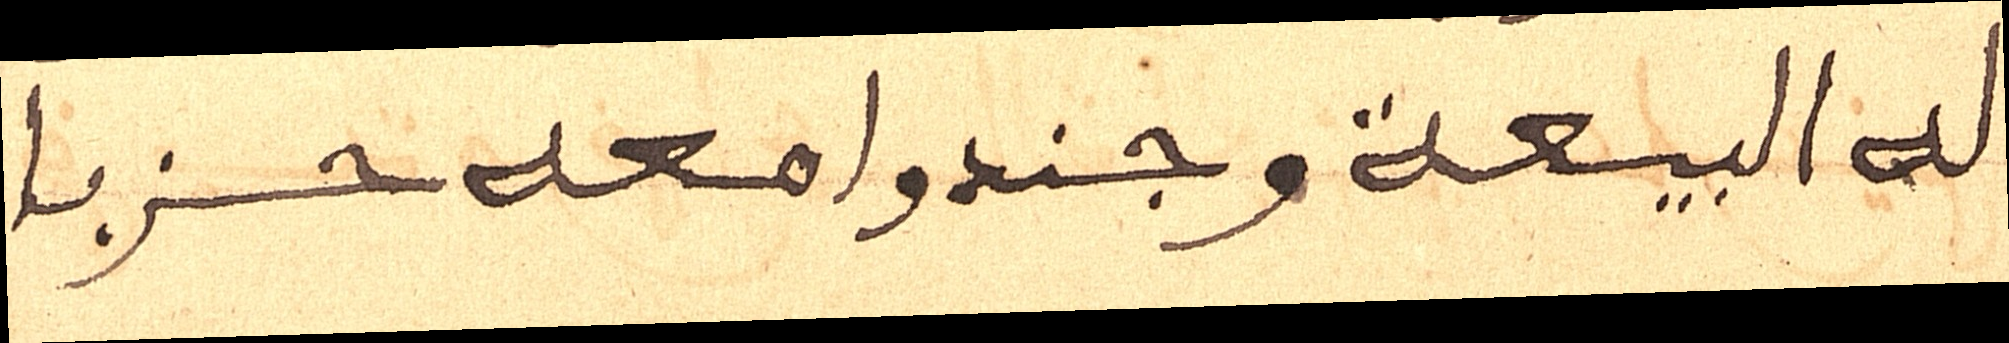له البيعة وجندوا معه حزبا
